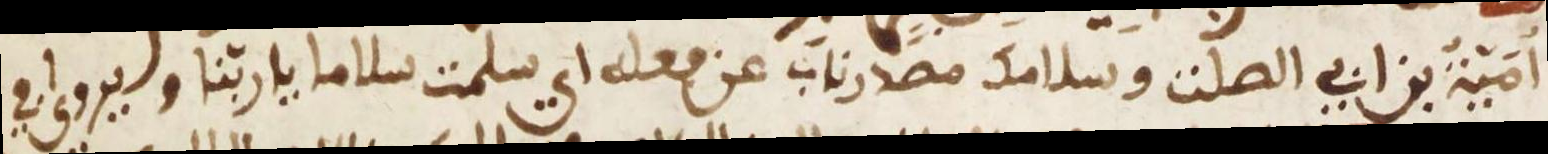امية بن ابي الصلت و سلامك مصدر ناب عن فعله اي سلمت سلاما يا ربنا و يروىٰ في
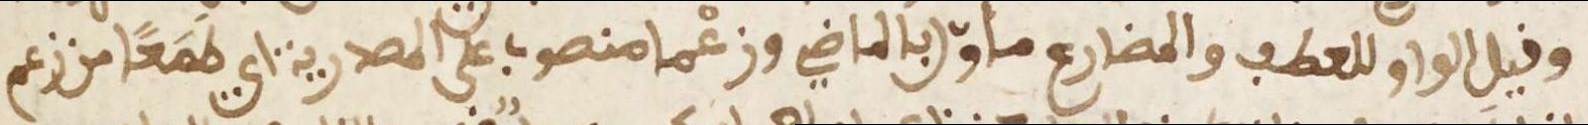و قيل الواو للعطف و المضارع مأول بالماضي و زعما منصوب على المصدرية اي طمعا من زعم
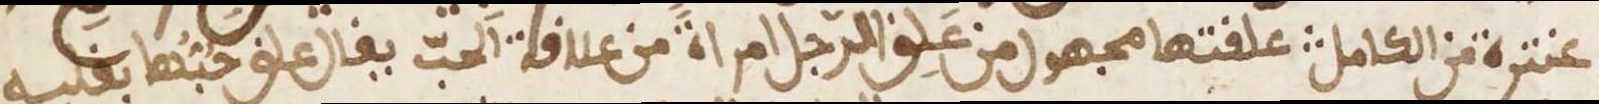عنترة من الكامل علقتها مجهول من علق الرجل امراة من علاقة الحب يقال علق حبها بقلبه
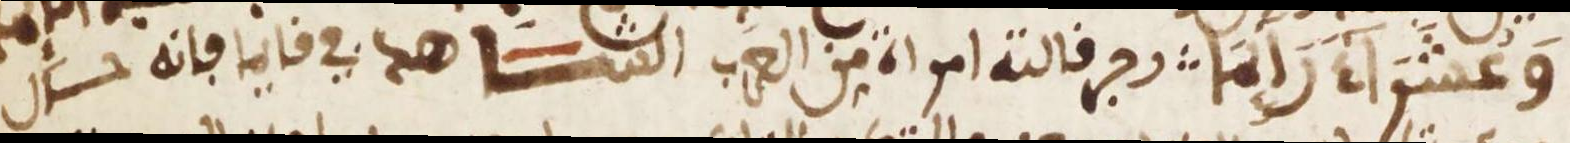و عشرآء رائما رجر قالته امراة من العرب الشاهد في قايما فانه حال
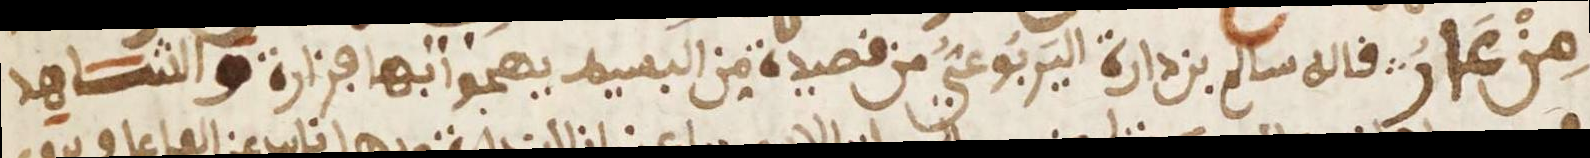من عار قاله سالم بن دارة اليربوعي من قصيدة من البسيط يهجوا بها فزارة و الشاهد
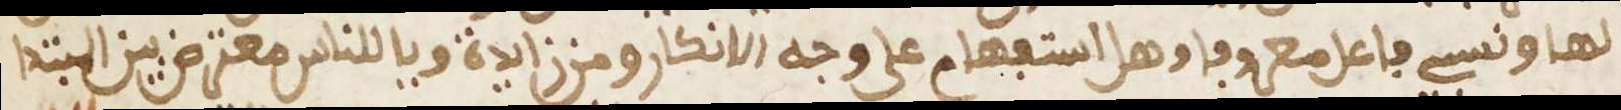لها و نسبي فاعل معروفا و هل استفهام على وجه الانكار و من زايدة و يا للناس معترض بين المبتدا
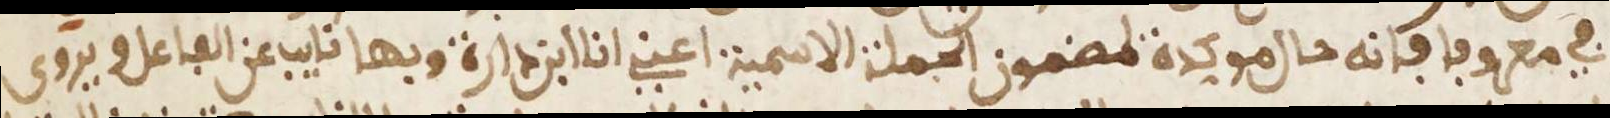في معروفا فانه حال موكدة لمضمون الجملة الاسمية اعني انا ابن دارة و بها نايب عن الفاعل و يروى
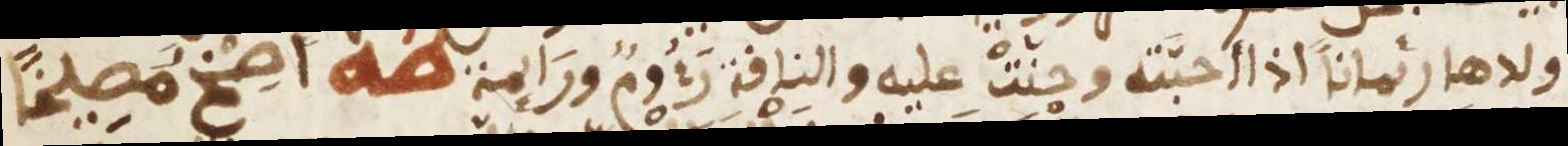ولدها رئمانا اذا أحبته و حنت عليه والناقة رءوم و رائمة ظه أصخ مصيخا
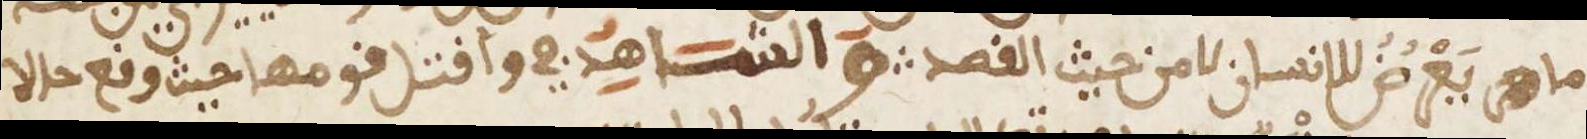ما يعرض للانسان لا من حيث القصد و الشاهد في و أقتل قومها حيث وقع حالا
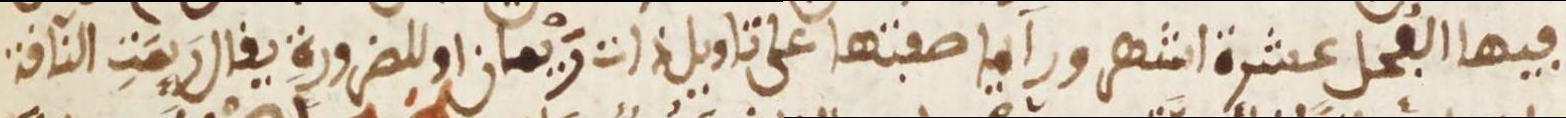فيها الفحل عشرة اشهر و رآيما صفتها على تاويل ذات ريمان او للضرورة يقال رئمت الناقة
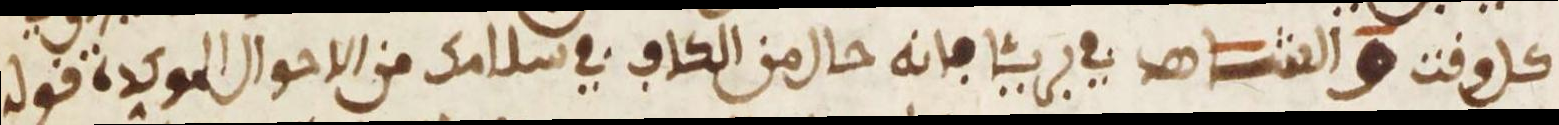كل وقت و الشاهد في بريئا فإنه حال من الكاف في سلامك من الاحوال الموكدة قوله
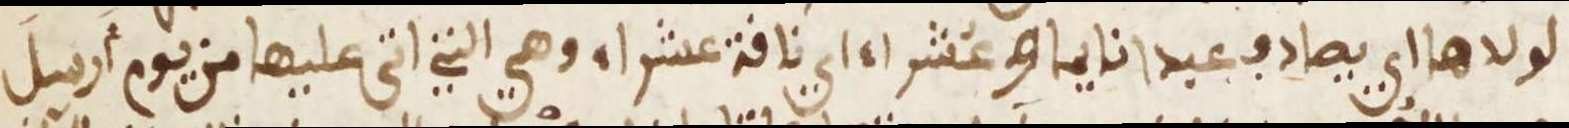لولدها اي يصادف عبدا نايما و عشراء اي ناقة عشراء و هي التي اتى عليها من يوم أرسل
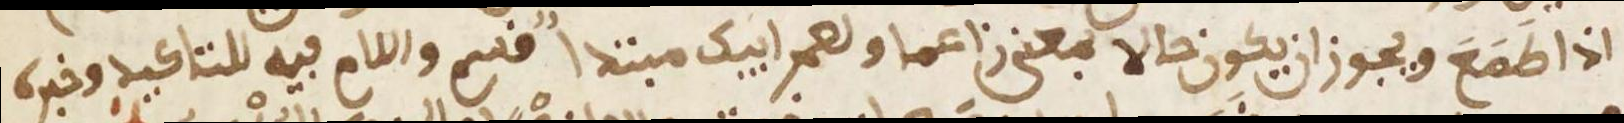اذا طمع و يجوز ان يكون حالا بمعنى زاعما و لعمر ابيك مبتدا قسم و الام فيه للتاكيد و خبره
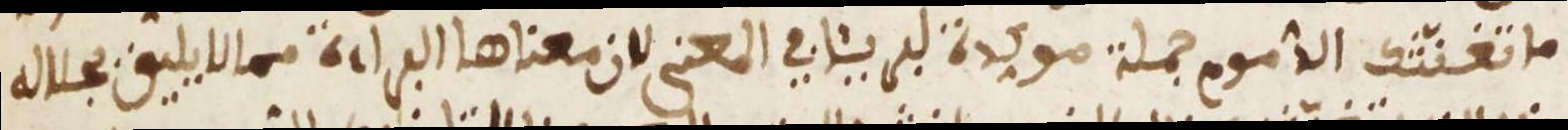ما تغنثك الذموم جملة موكدة لبريئا في المعنى لان معناها البراءة مما لا يليق بجلاله
